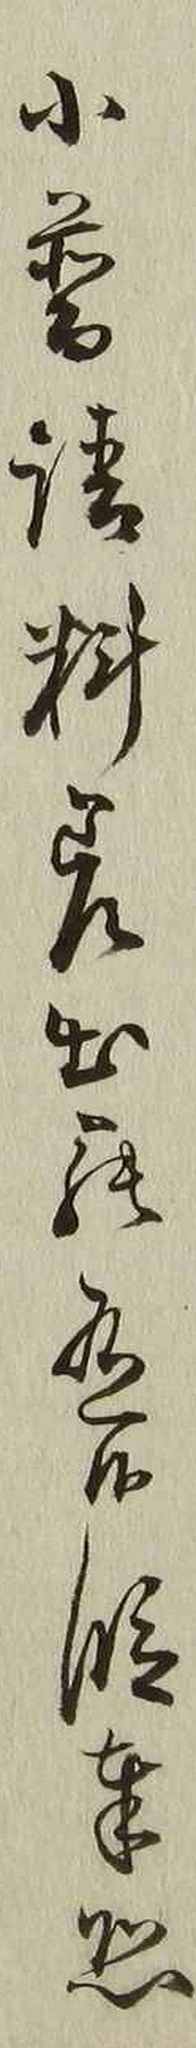小普請料差出罷有候段奉恐
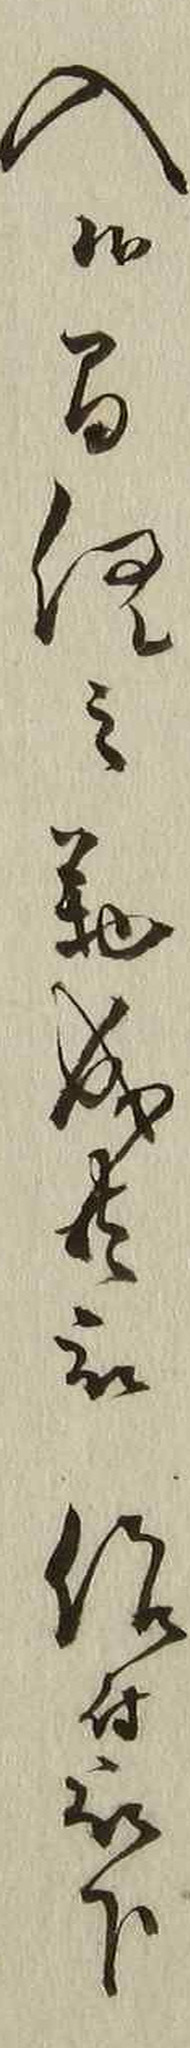入候間何之勤成共被仰付被下
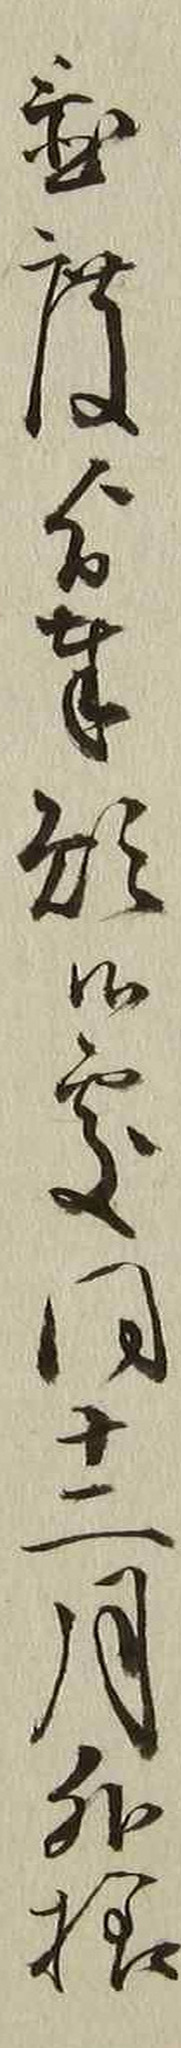置度旨奉願候処同十二月外様
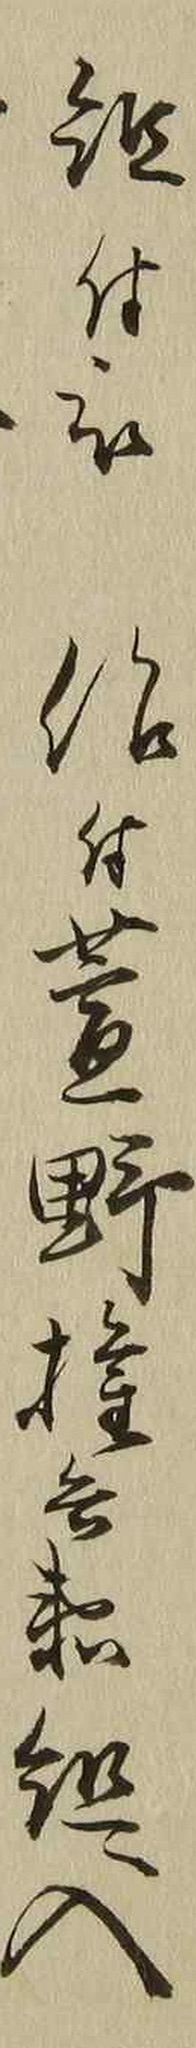組付被仰付萱野権兵衛組へ入
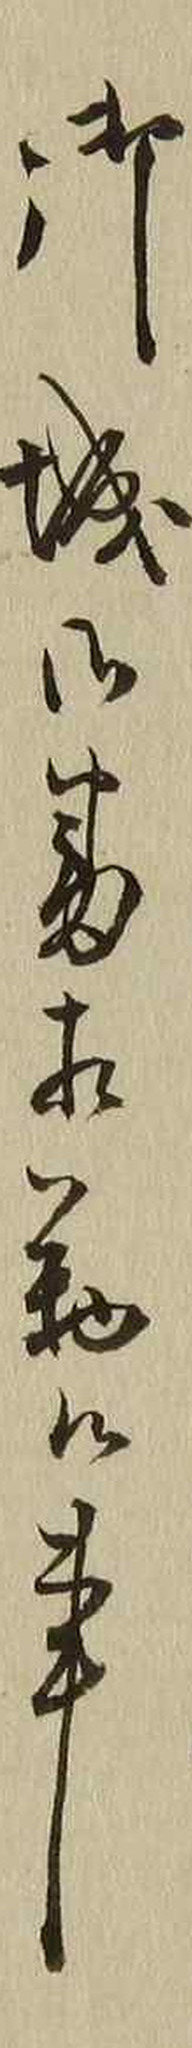御城御番相勤候事
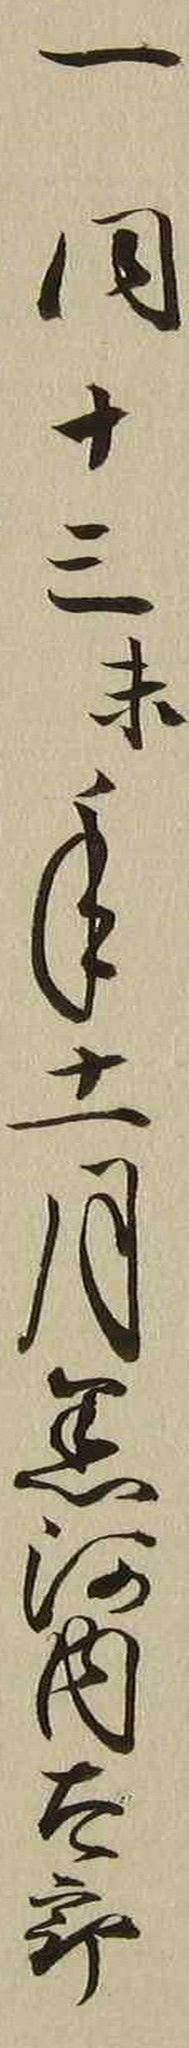一同十三未年十一月黒河内太郎
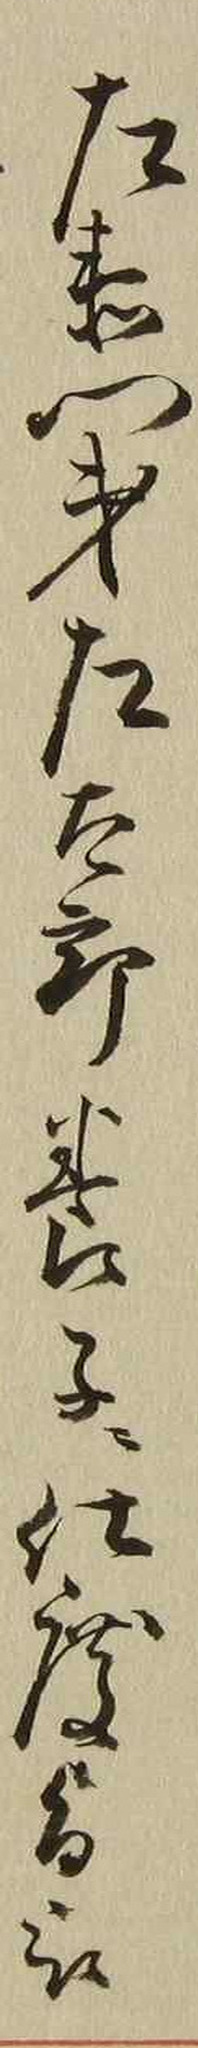左衛門弟左太郎養子ニ仕度旨被
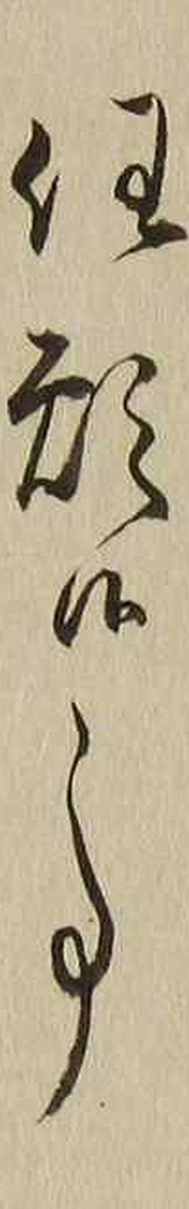任願候事
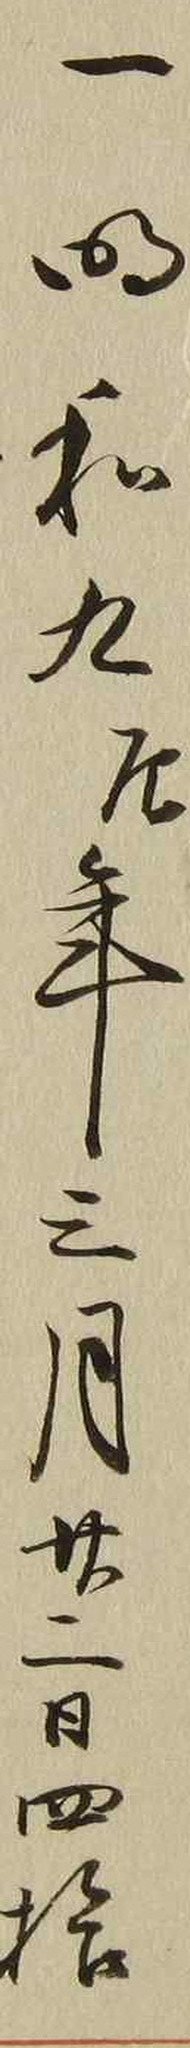一明和九辰年三月廿二日四拾
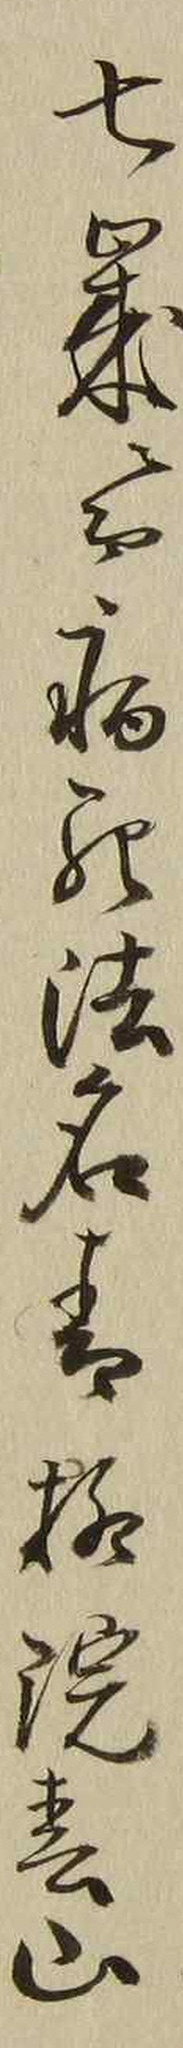七歳ニ而病死法名青柳院春山
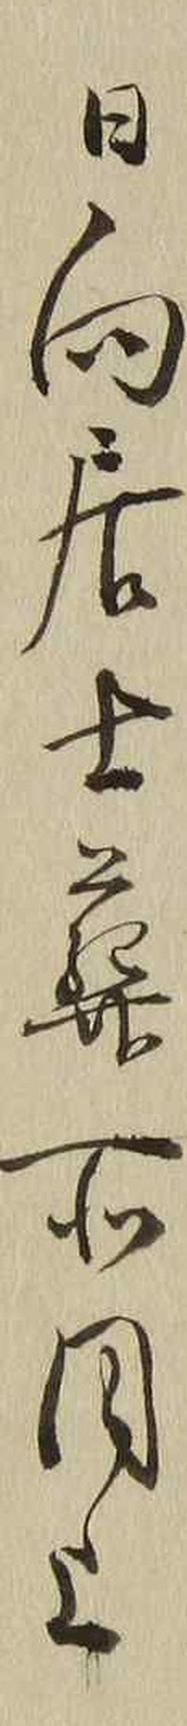日向居士葬所同上
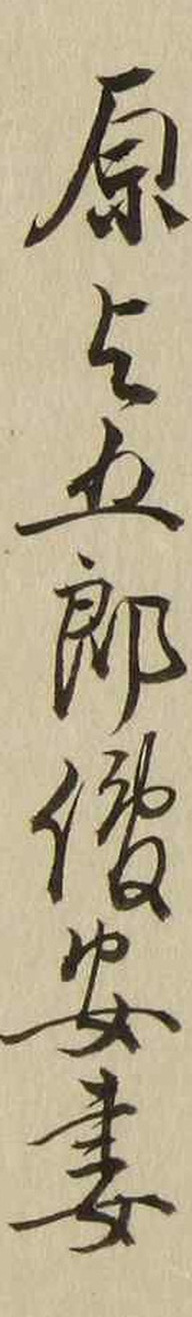女原与五郎俊安妻

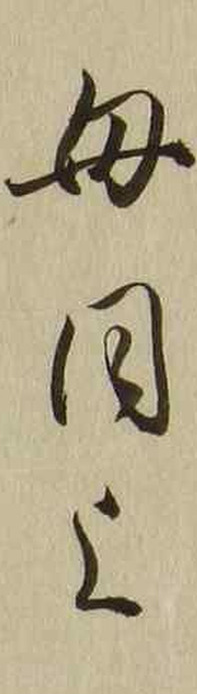母同上
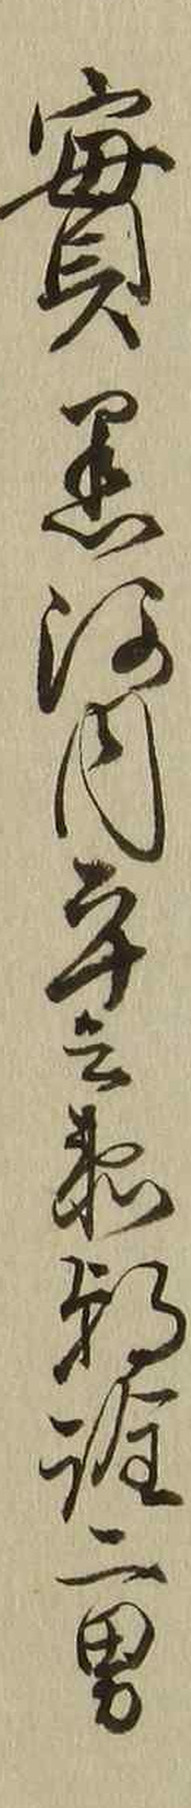実黒河内平兵衛朝詮二男
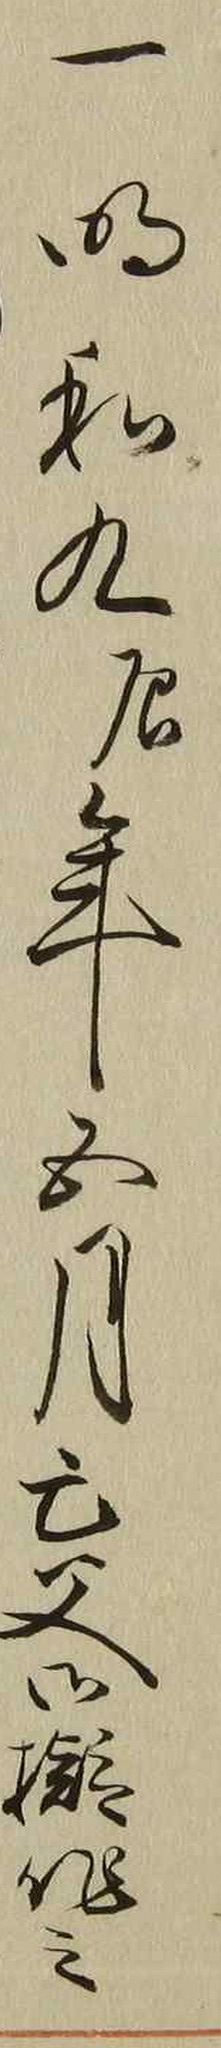一明和九辰年五月亡父御擬作之
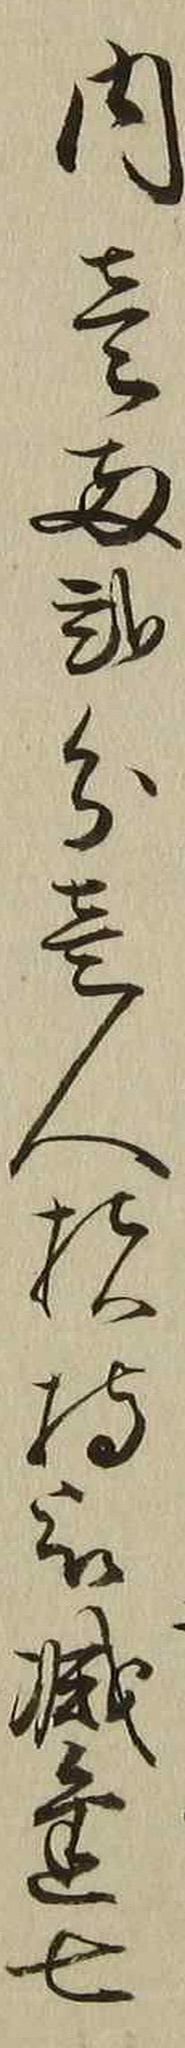内壱両弐分壱人扶持被減金七
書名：諸士系譜　巻之57　ほ之部4
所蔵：会津若松市立会津図書館
